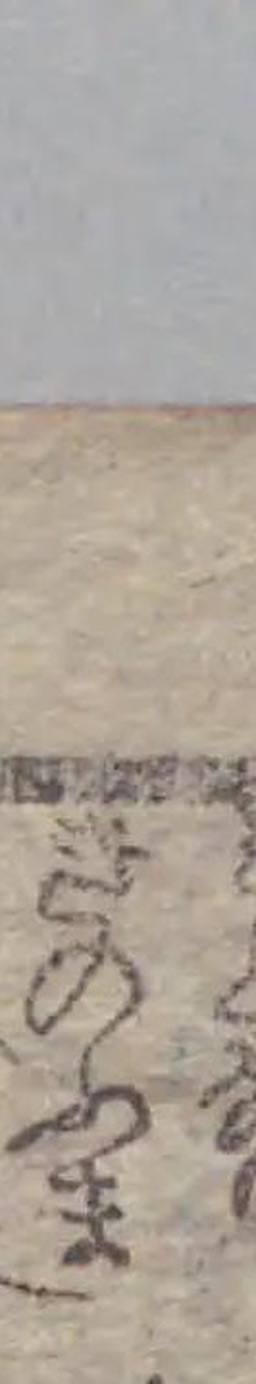きのふま
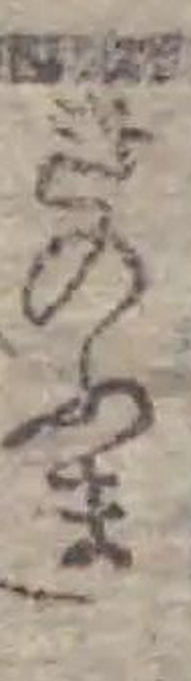きのふま
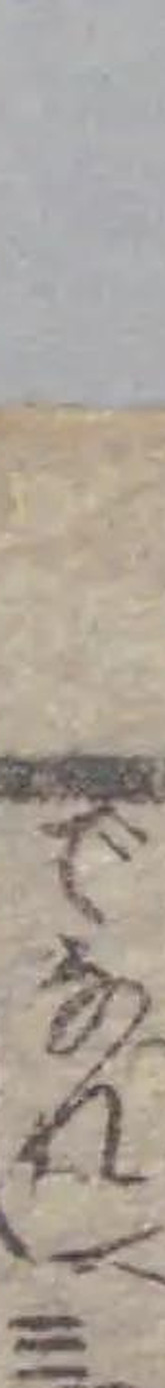でなれし
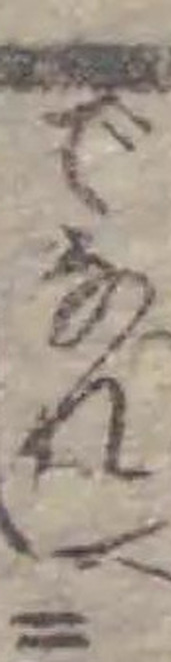でなれし
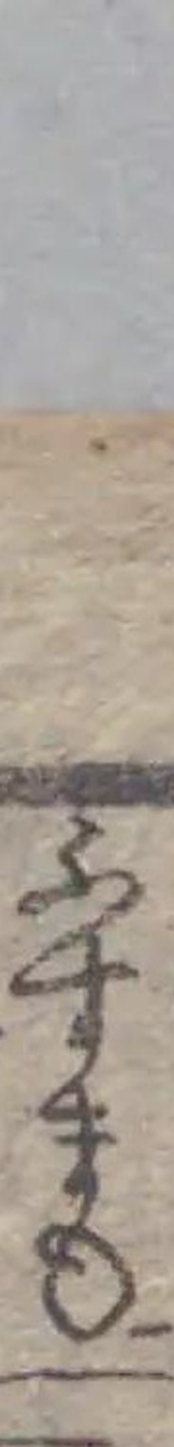ふすまも
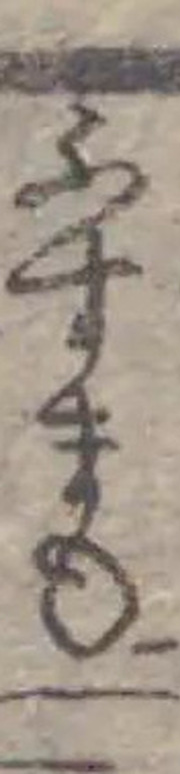ふすまも
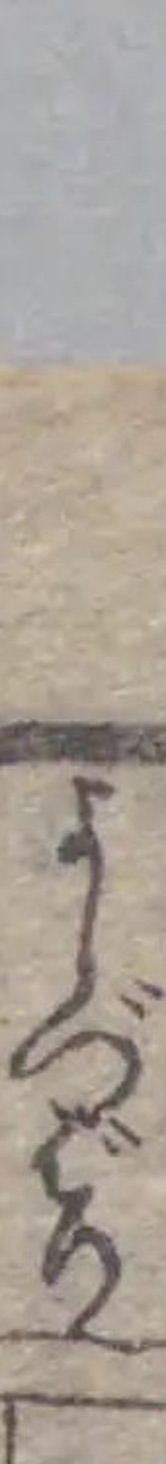よしづばり
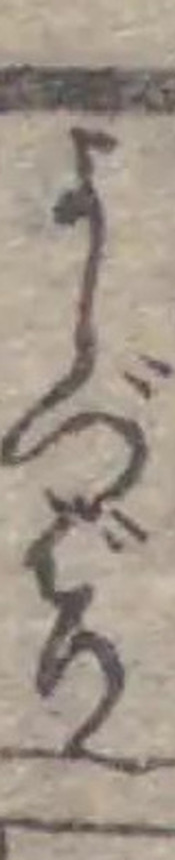よしづばり
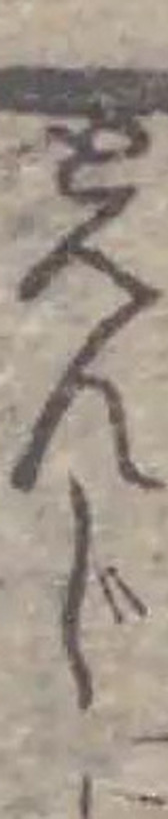とへんじ
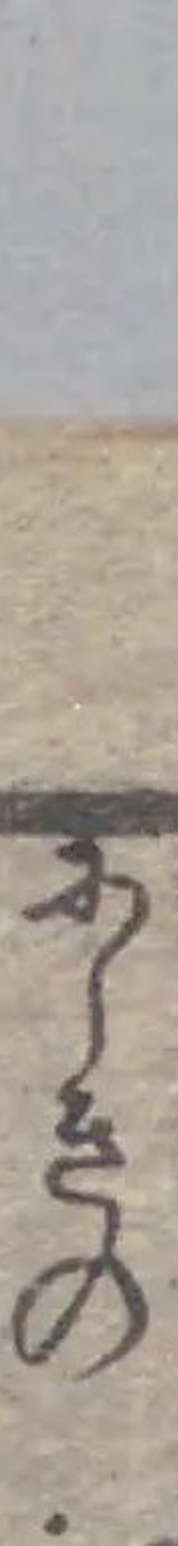にしきの
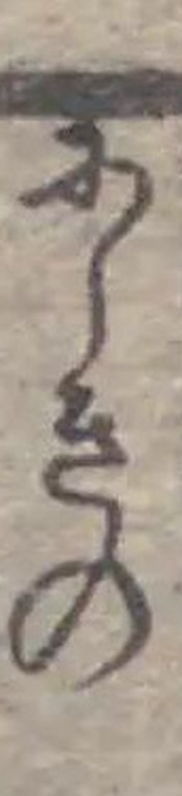にしきの
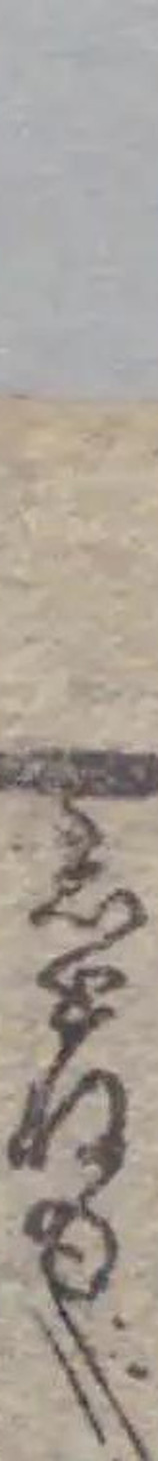しとねも
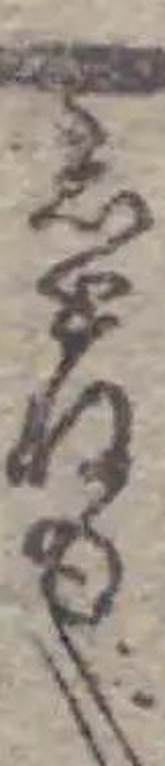しとねも
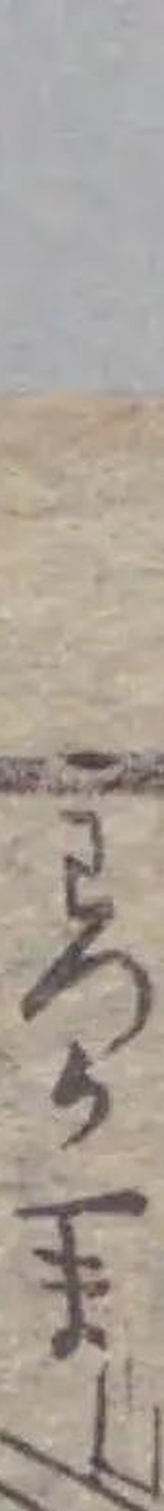わつか一ま
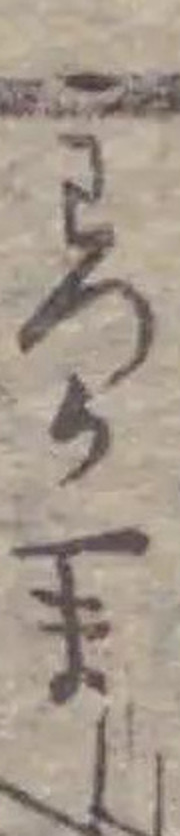わつか一ま
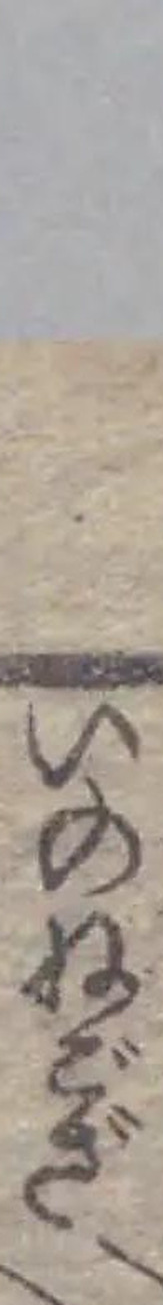いのねござ
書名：かんなんの夢枕 2巻
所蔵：国立国会図書館 National Diet Library, JAPAN
